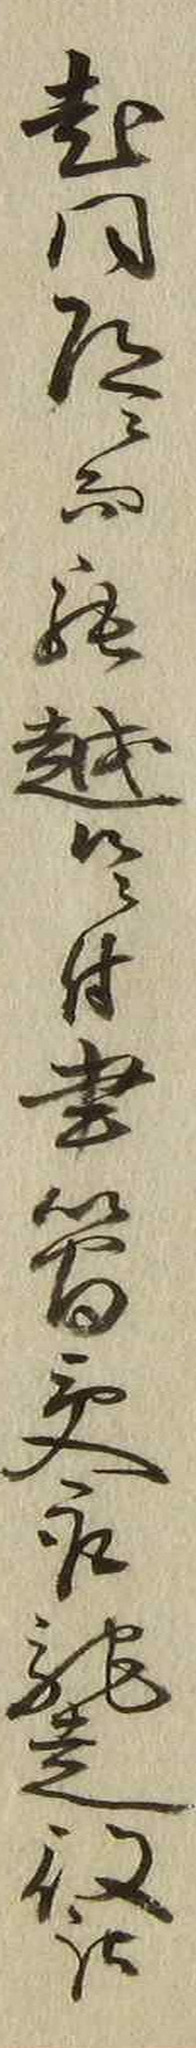老同道ニ而罷越候ニ付書簡受取馳走役被
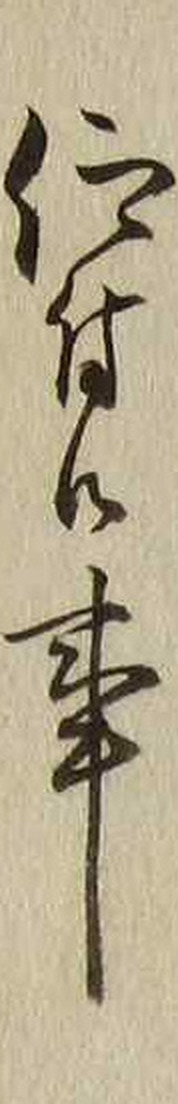仰付候事
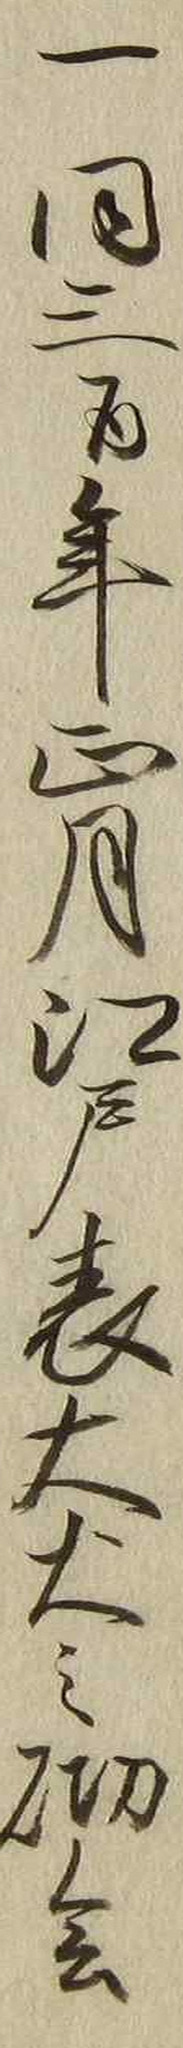一同三酉年正月江戸表大火之砌会
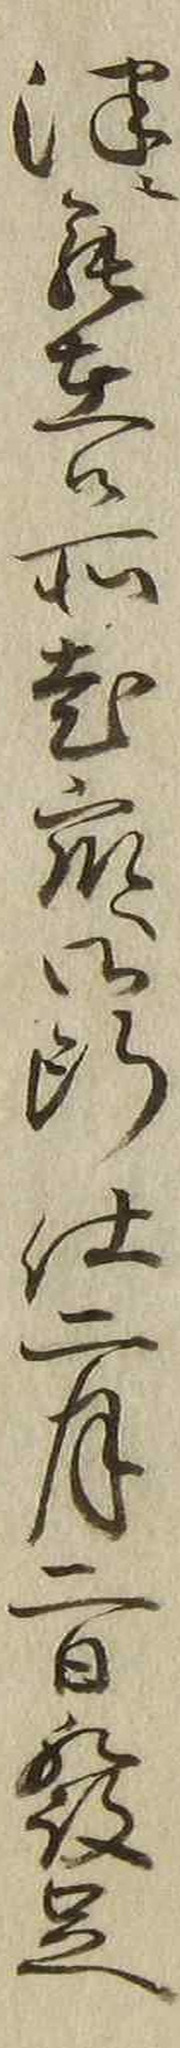津ニ罷在候所老衆へ御断仕二月二日発足
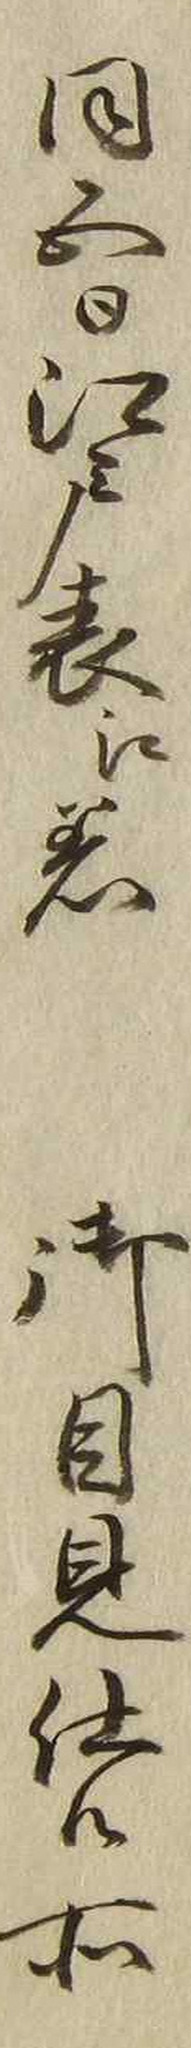同五日江戸表へ着御目見仕候所
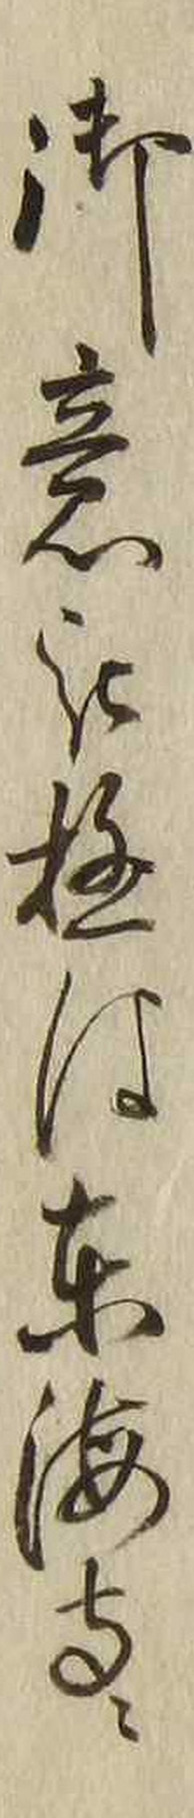御意被遊は東海寺ニ

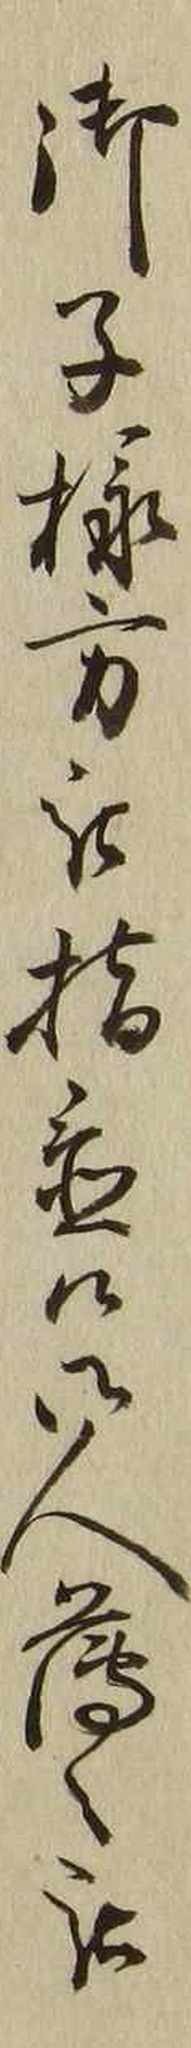御子様方被指置候御人薄之被
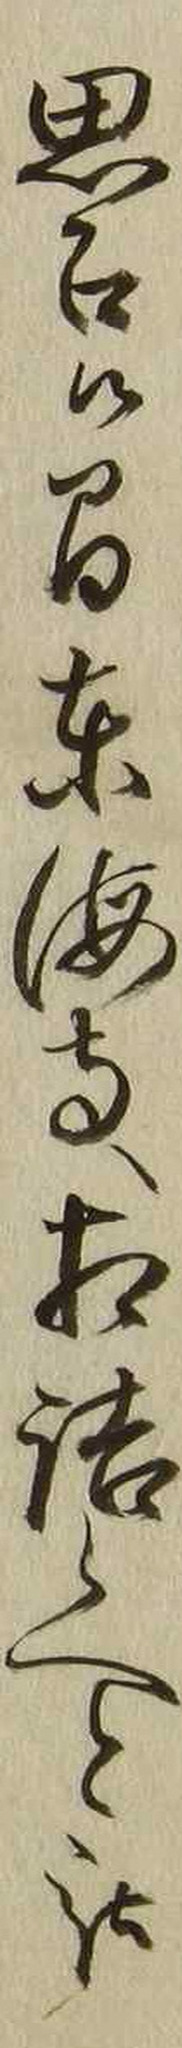思召候間東海寺へ相詰候へと被
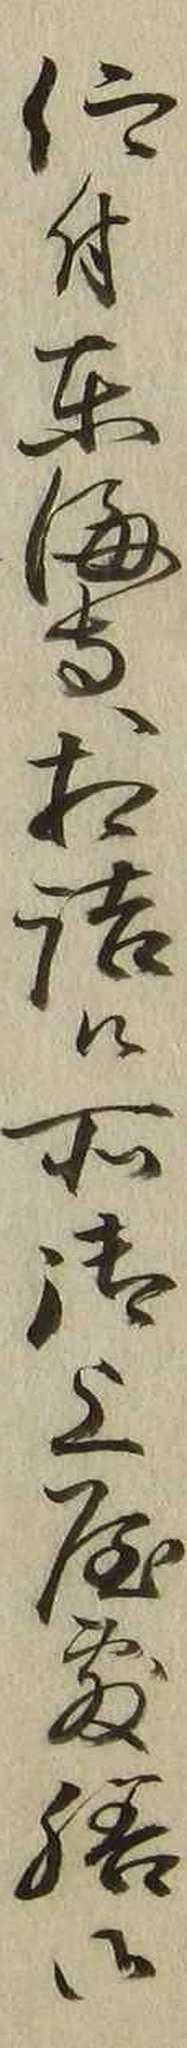仰付東海寺へ相詰候所御上屋敷繕御
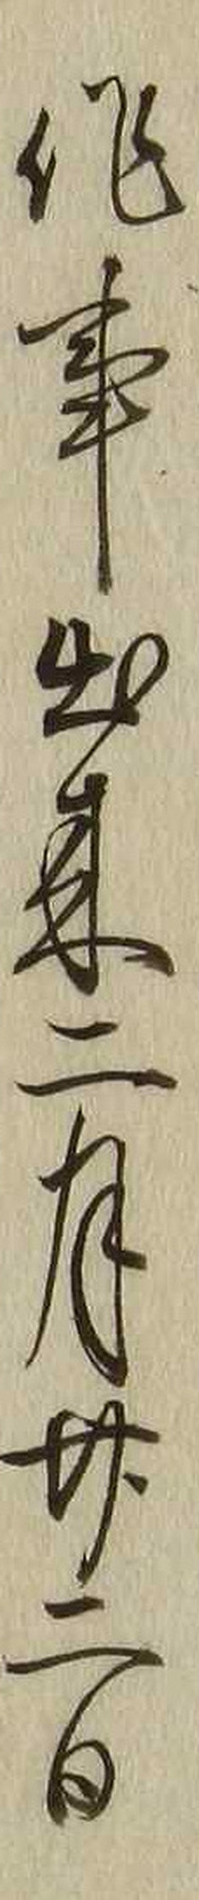作事出来二月廿二日
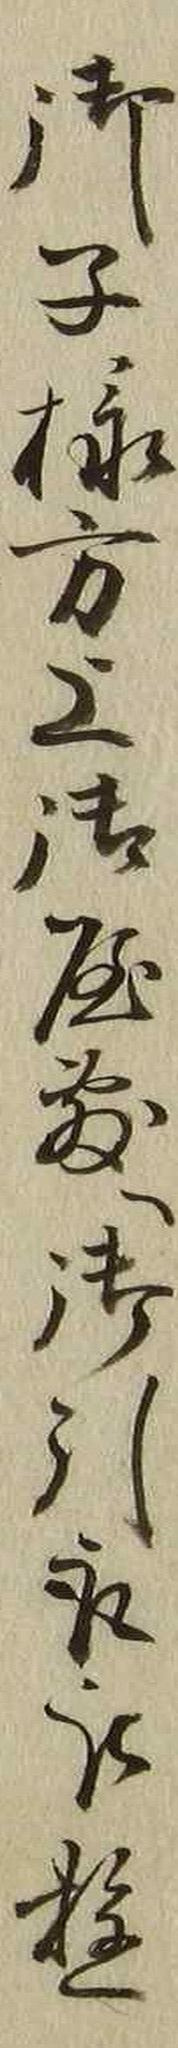御子様方上御屋敷へ御引取被遊
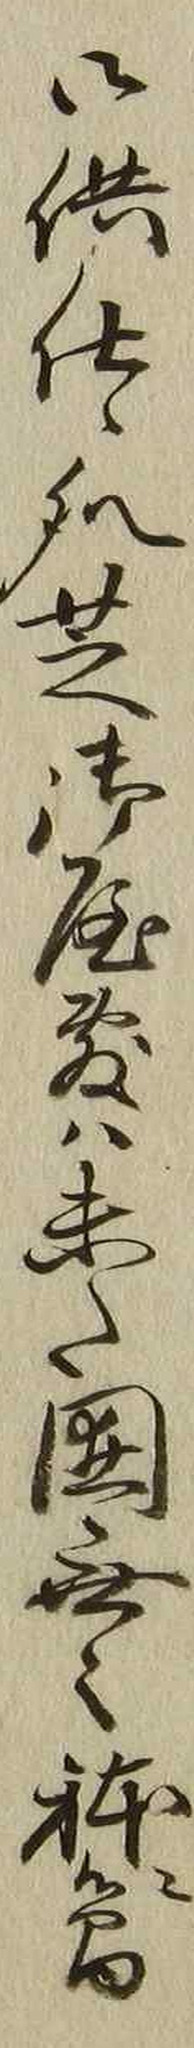御供仕候処芝御屋敷ハ未だ囲無之体ニ候間
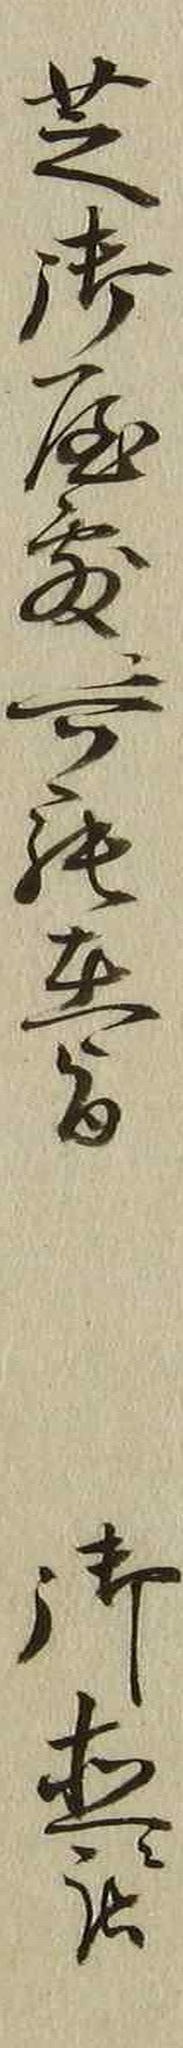芝御屋敷ニ可罷在旨御直ニ被
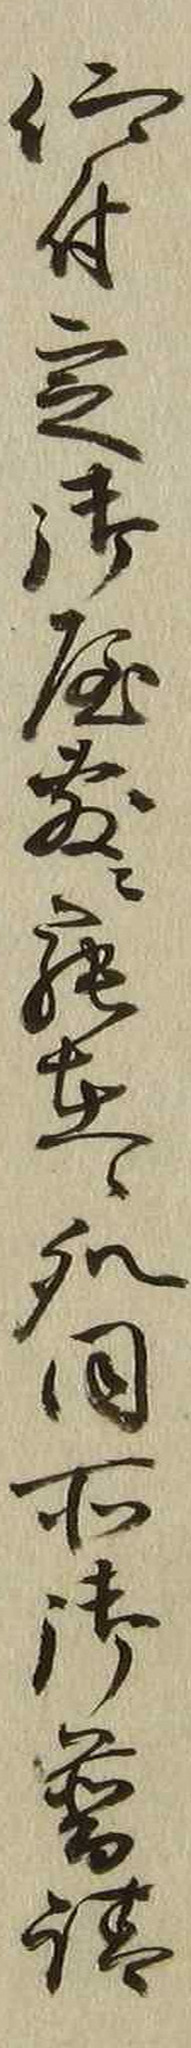仰付定御屋敷ニ罷在候処同所御普請
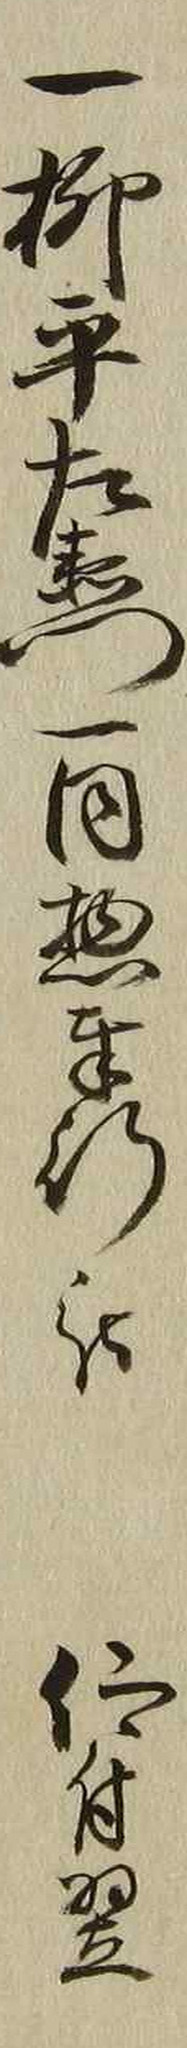一柳平左衛門一同惣奉行被仰付翌
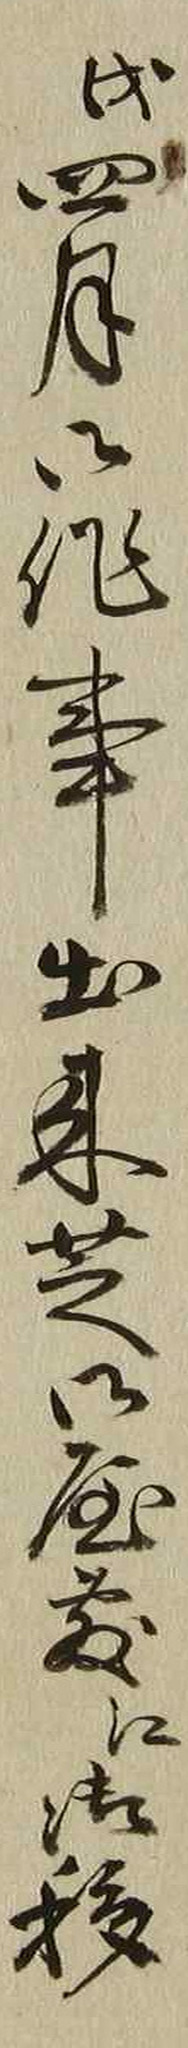戌四月御作事出来芝御屋敷江御移
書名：諸士系譜　巻之60　と之部3
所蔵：会津若松市立会津図書館
